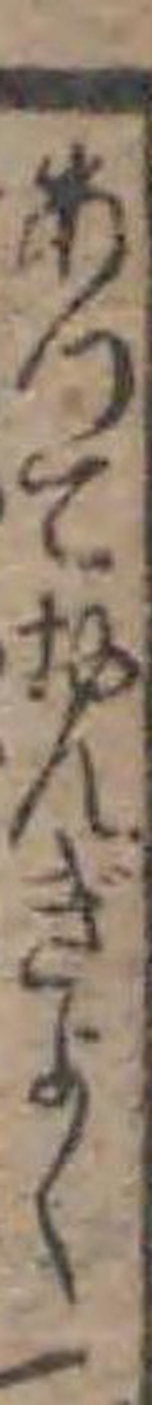あつておんぎよく
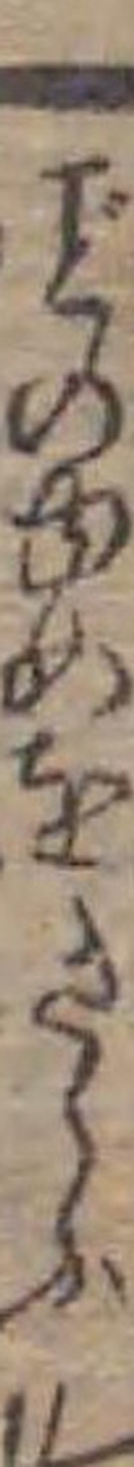ごとのゆめをきらふ
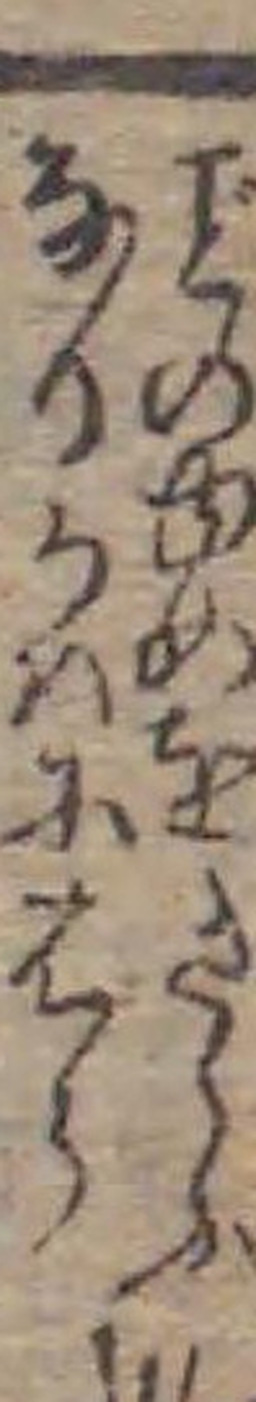なりかはにはら
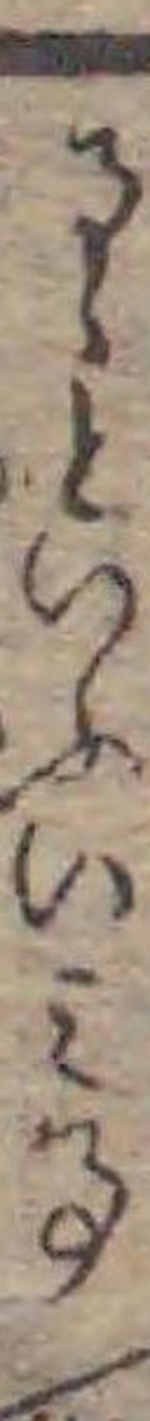るゝといふいみ事
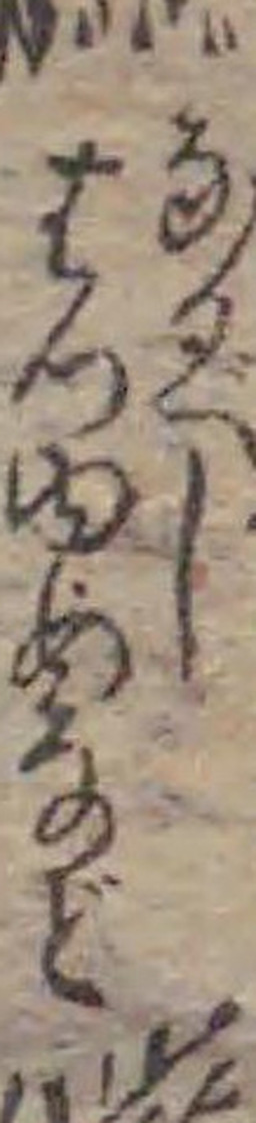はつゆめなど
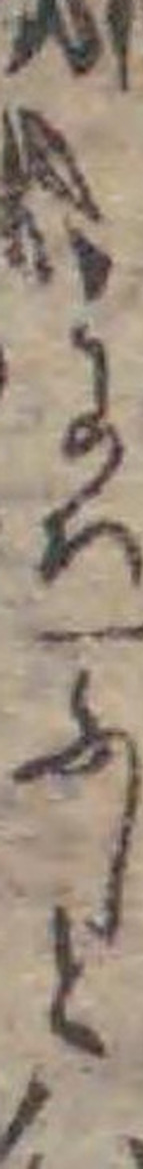には一ふしと
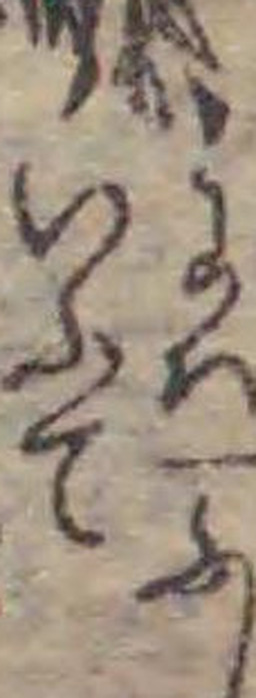いふて
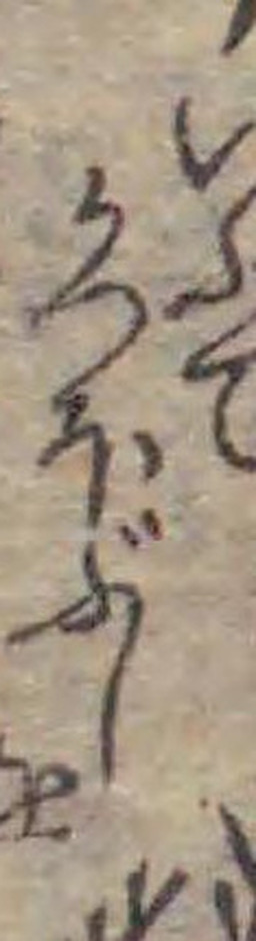かつほぶしを
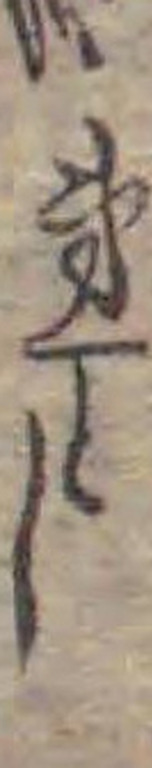第一とし
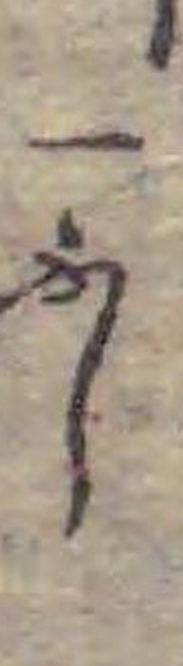一ふし
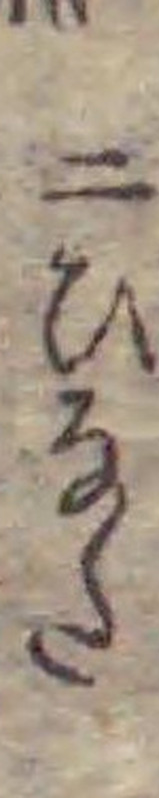二ひなた
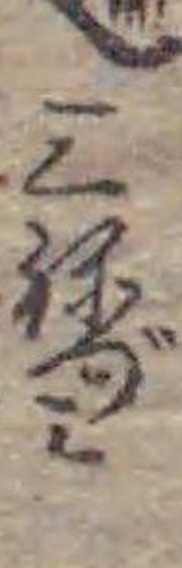三ねづみ
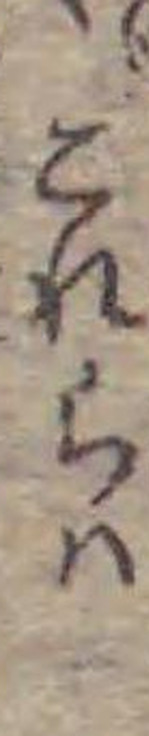これらは
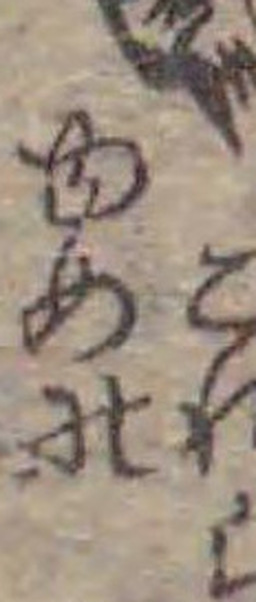ゆめの

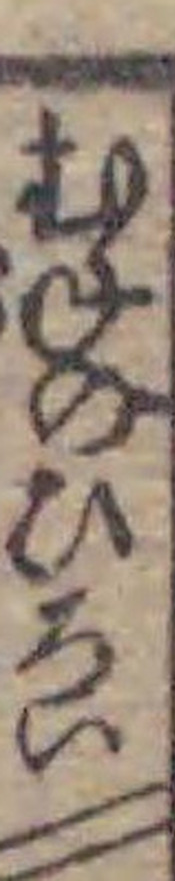むねのひろい
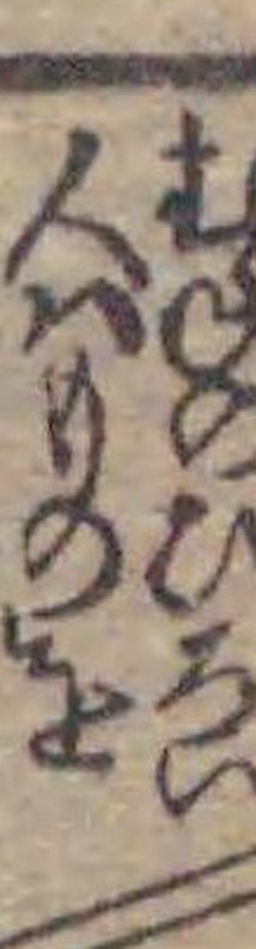人はものを
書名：怪物つれつれ草 : 2巻
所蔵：国立国会図書館 National Diet Library, JAPAN
